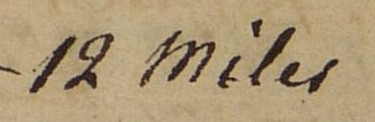12 Miles
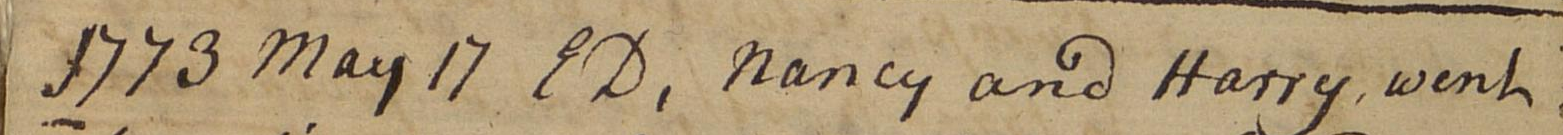1773 May 17 ED, Nancy and Harry went
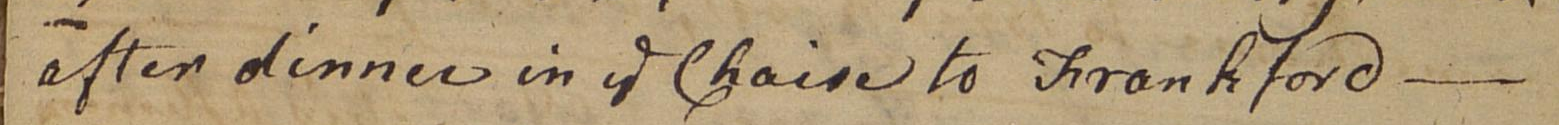after dinner in y^e Chaise to Frankford-
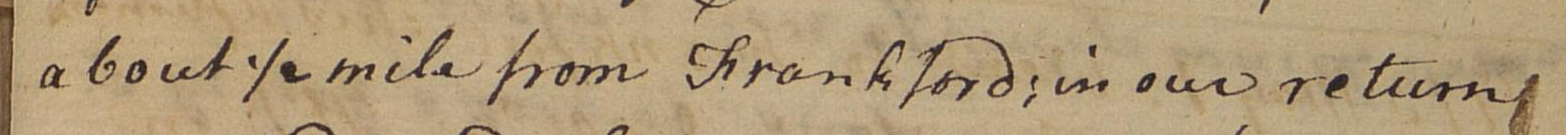a bout 1/2 mile from Frankford, in our return
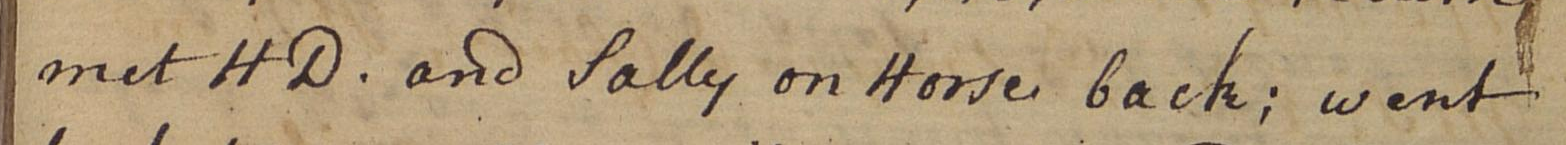met HD. and Sally on Horse back; went
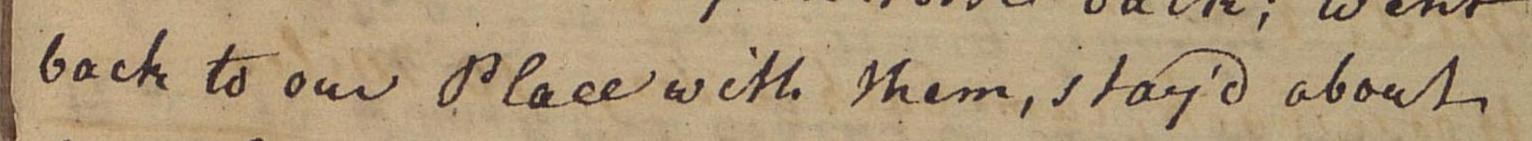back to our Place with them, stay'd about
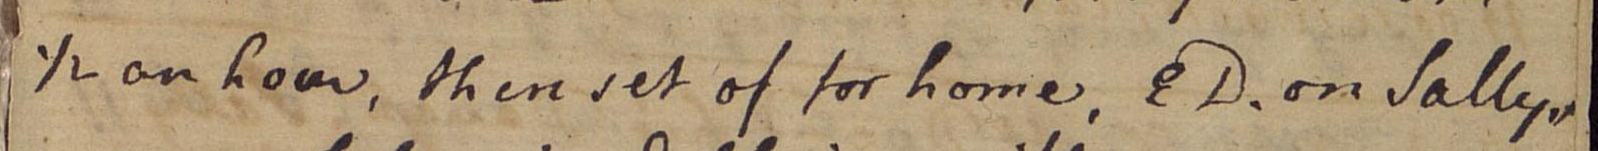1/2 on hour, then set of for home. ED. on Sallys
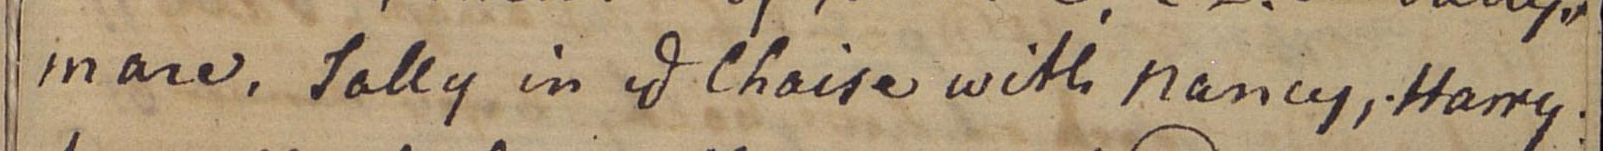mare. Sally in y^e Chaise with Nancy, Harry
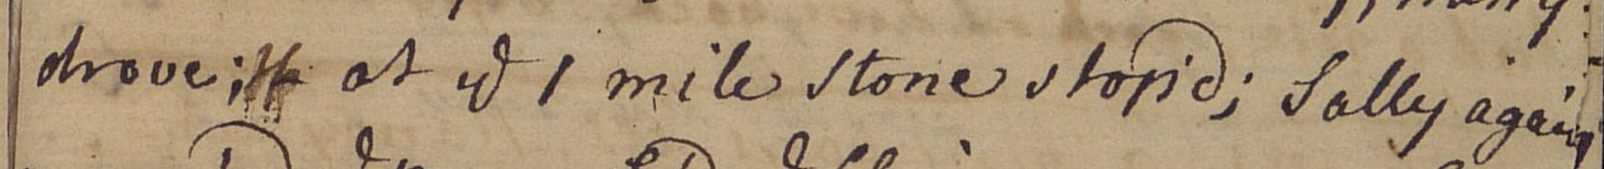drove at y^e 1 mile stone stop'd; Sally again
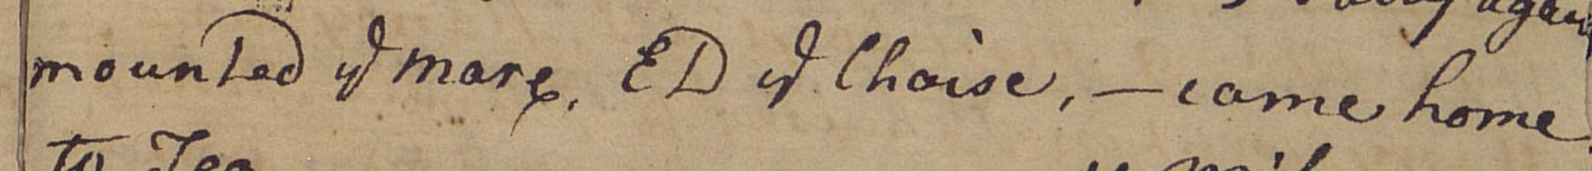mounted y^e mare, ED y^e Chaise,- came home
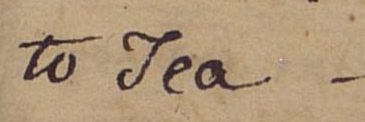to Tea -
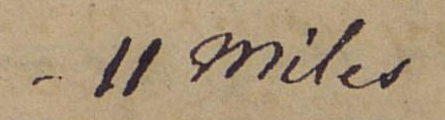-11 Miles
